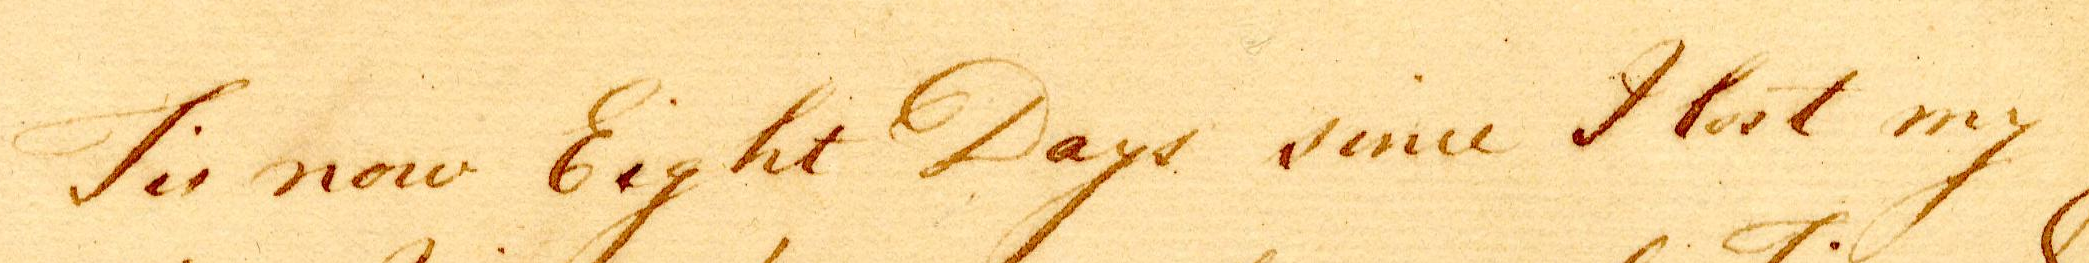Tis now Eight Days since I lost my
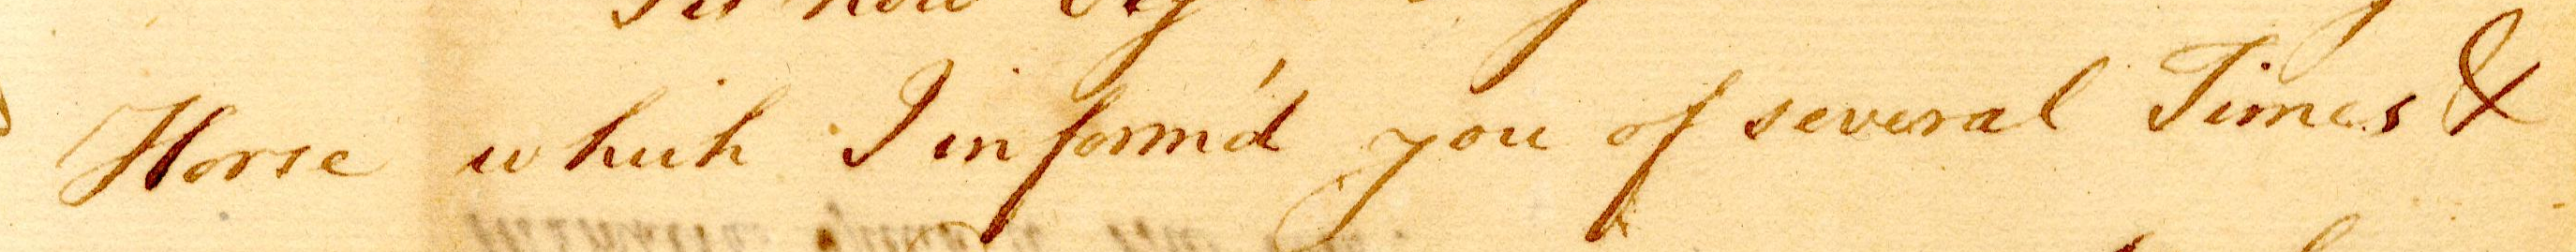Horse which I inform'd you of several Times &
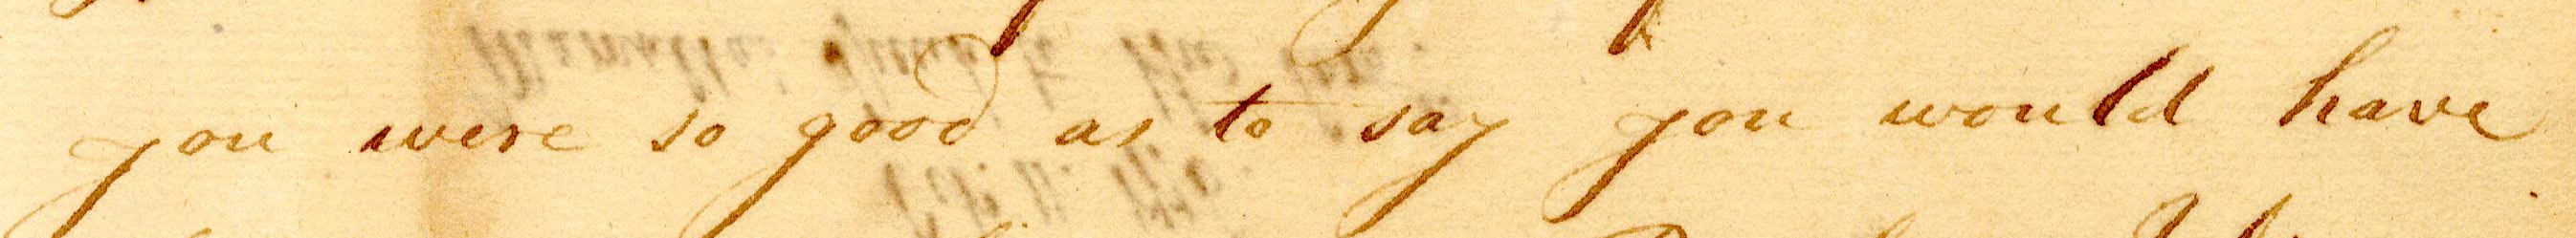You were so good as to say you would have
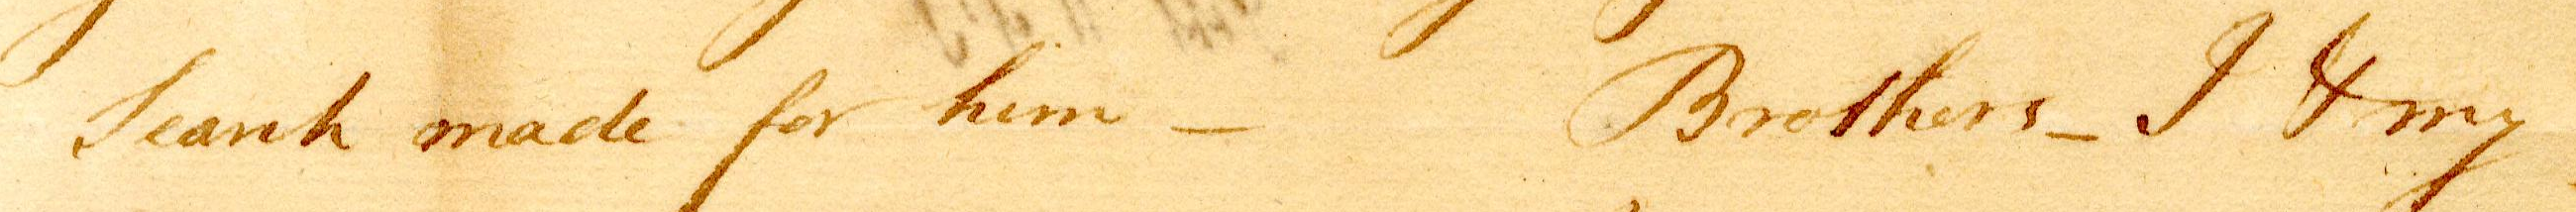Search made for him. Brothers, I & my
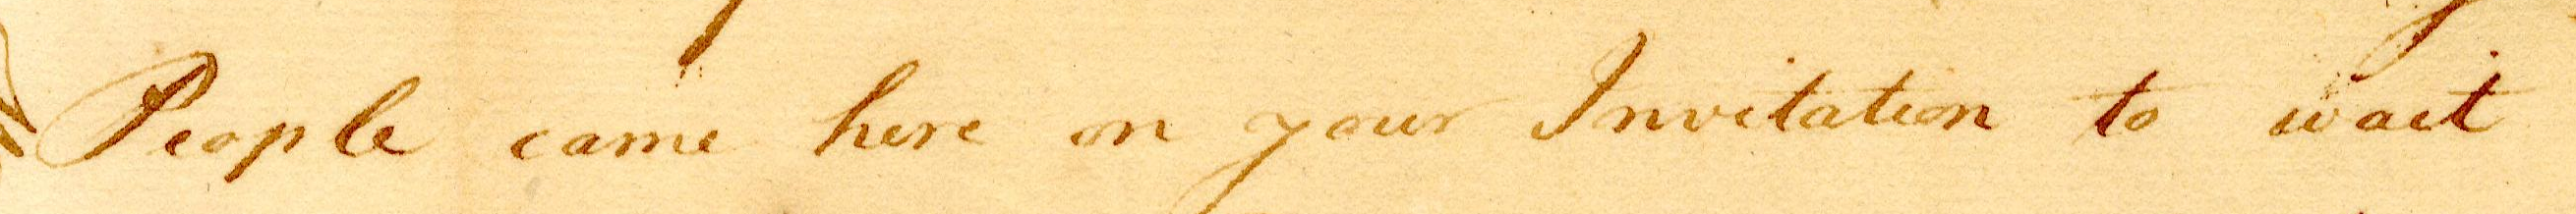People came here on your Invitation to wait
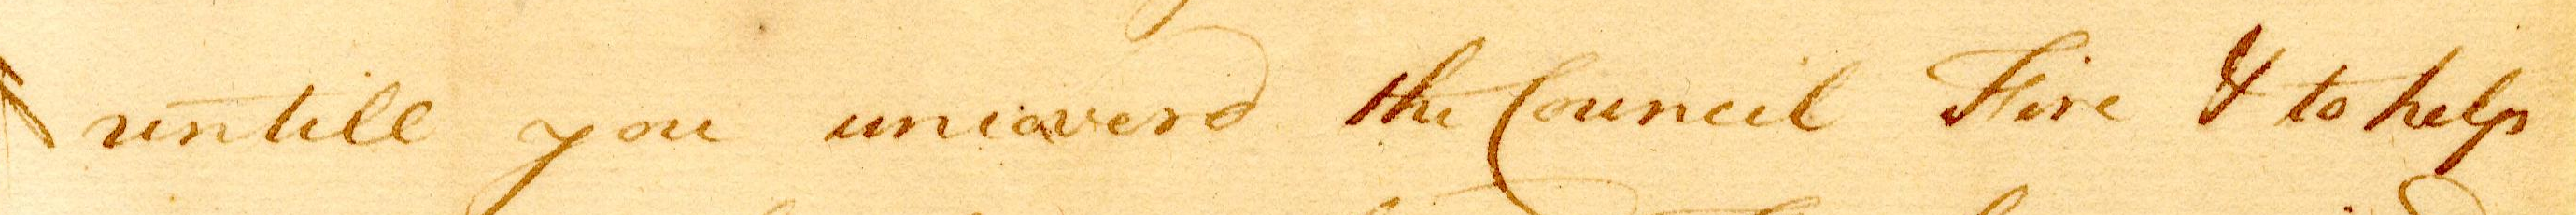untill you uncovered the Council Fire & to help
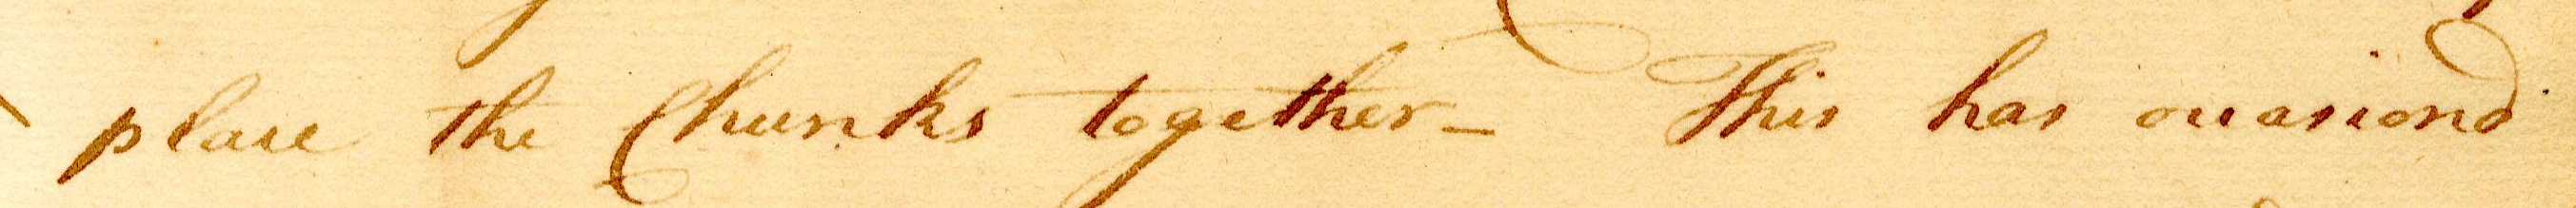place the Chunks together. This has occasiond
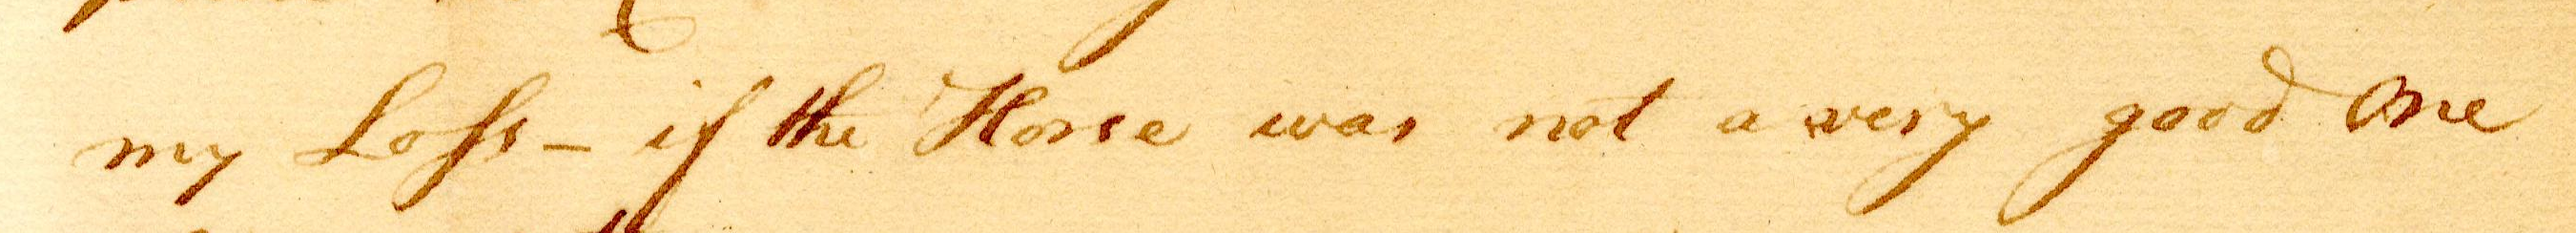my Loss, if the Horse was not a very good one
